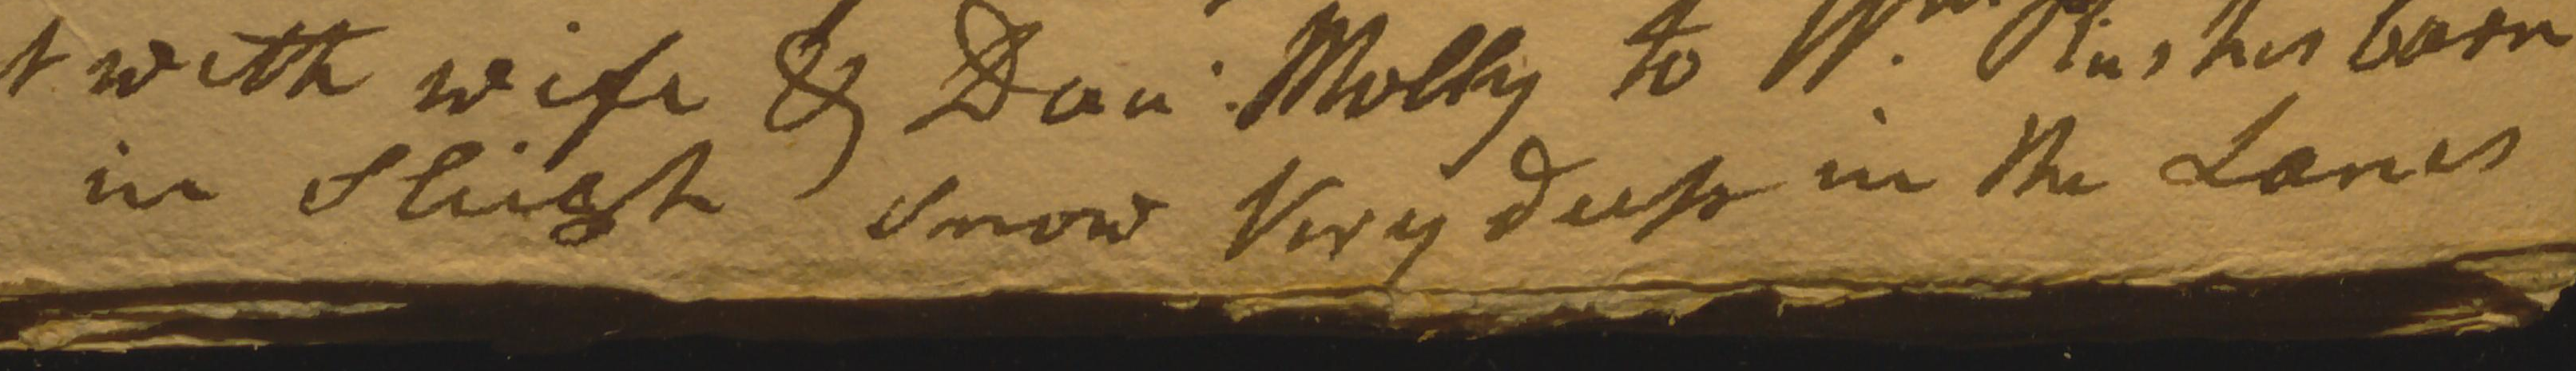in Sleigh Snow Very deep in the Lanes
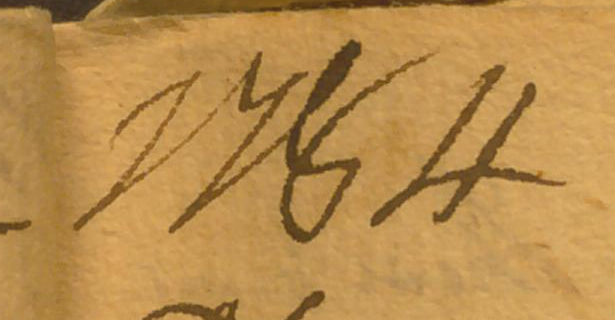1784
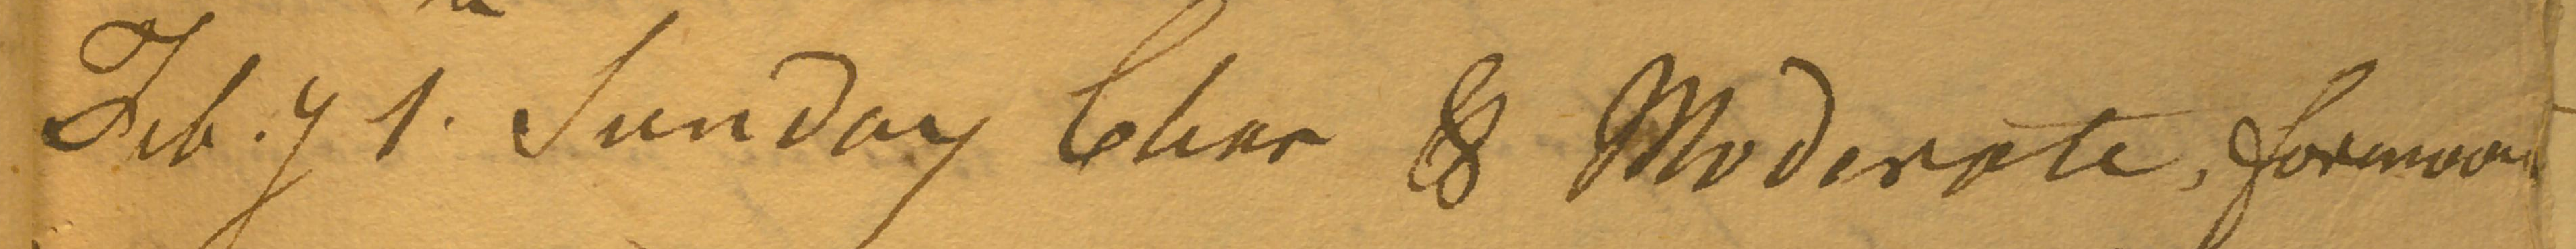Feb^y. 1^th. Sunday Clear & Moderate, fornoon
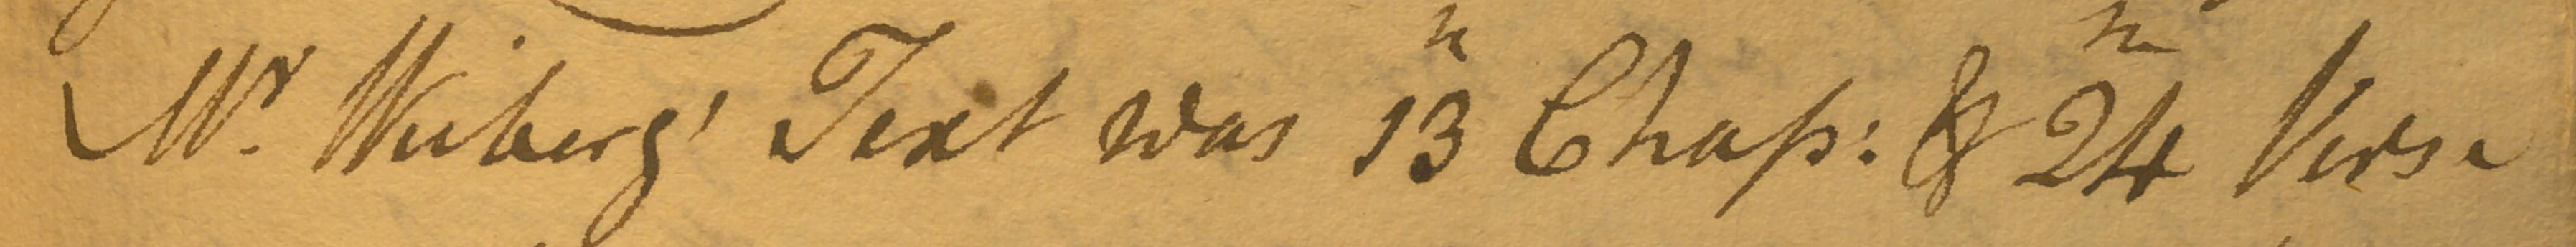M^r. Weiberg Text was 13^h Chap: & 24^th Verse
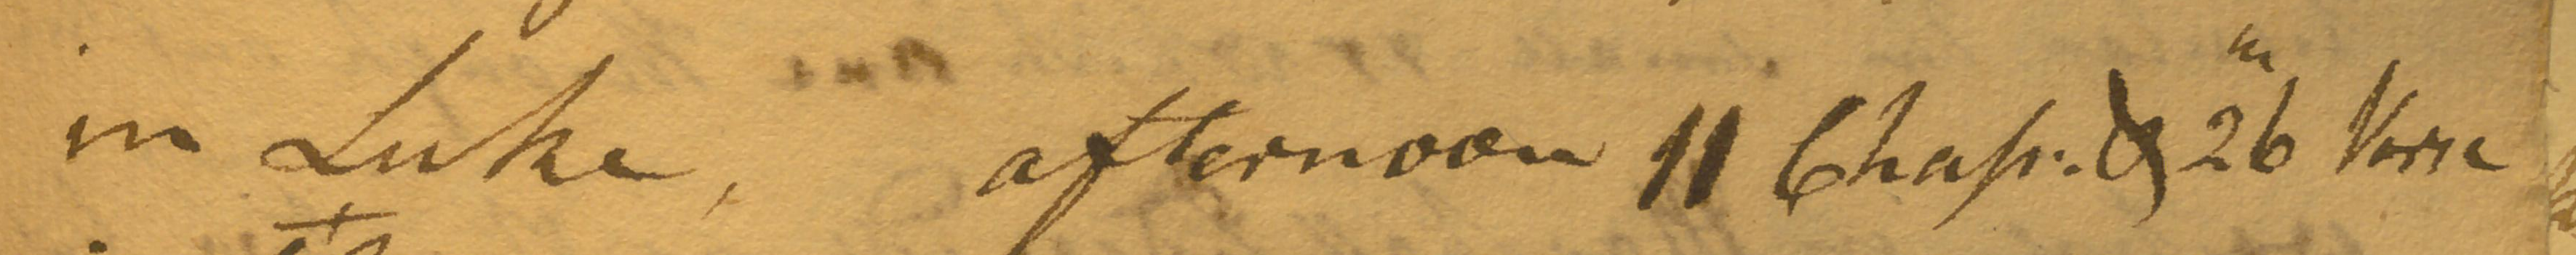in Luke, afternoon 11 Chap. & 26^th Verse
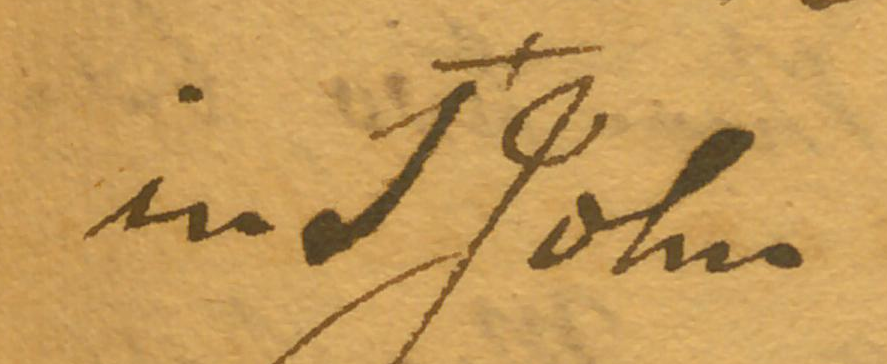in S^t John
